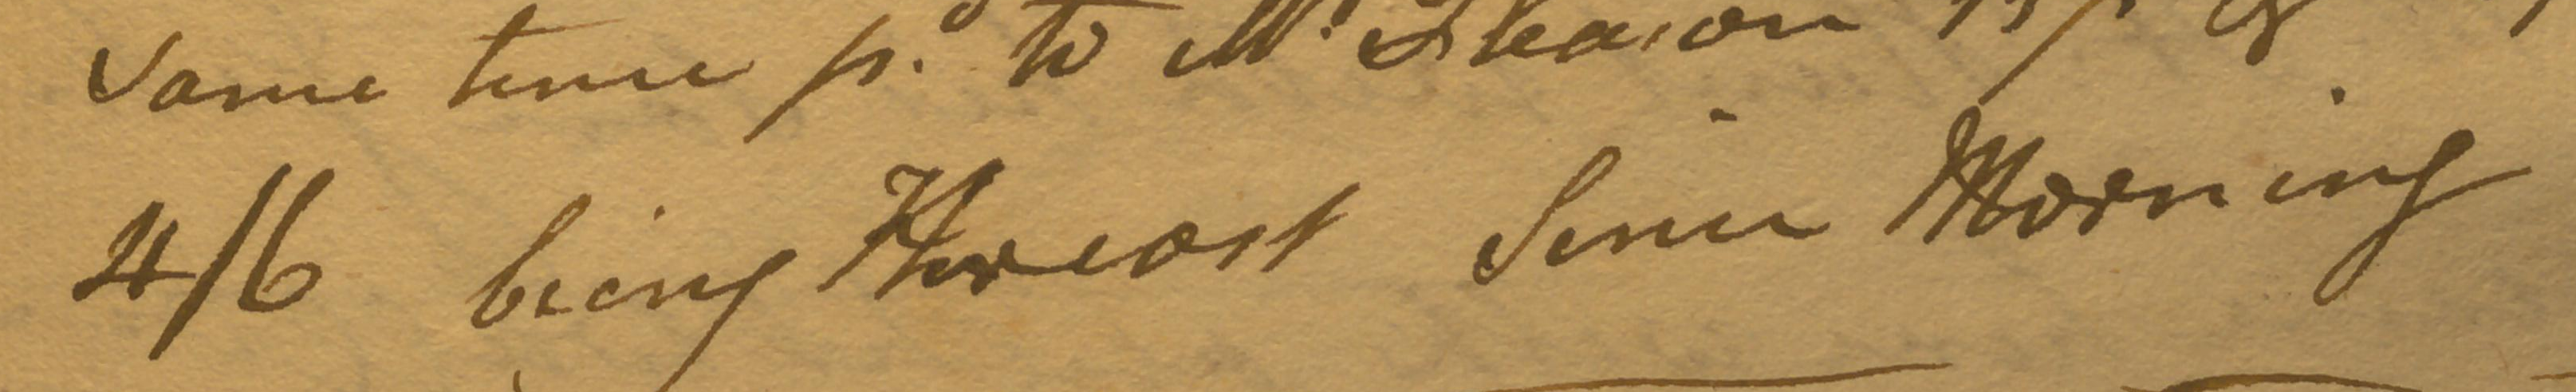4s6 being the cost since Morning
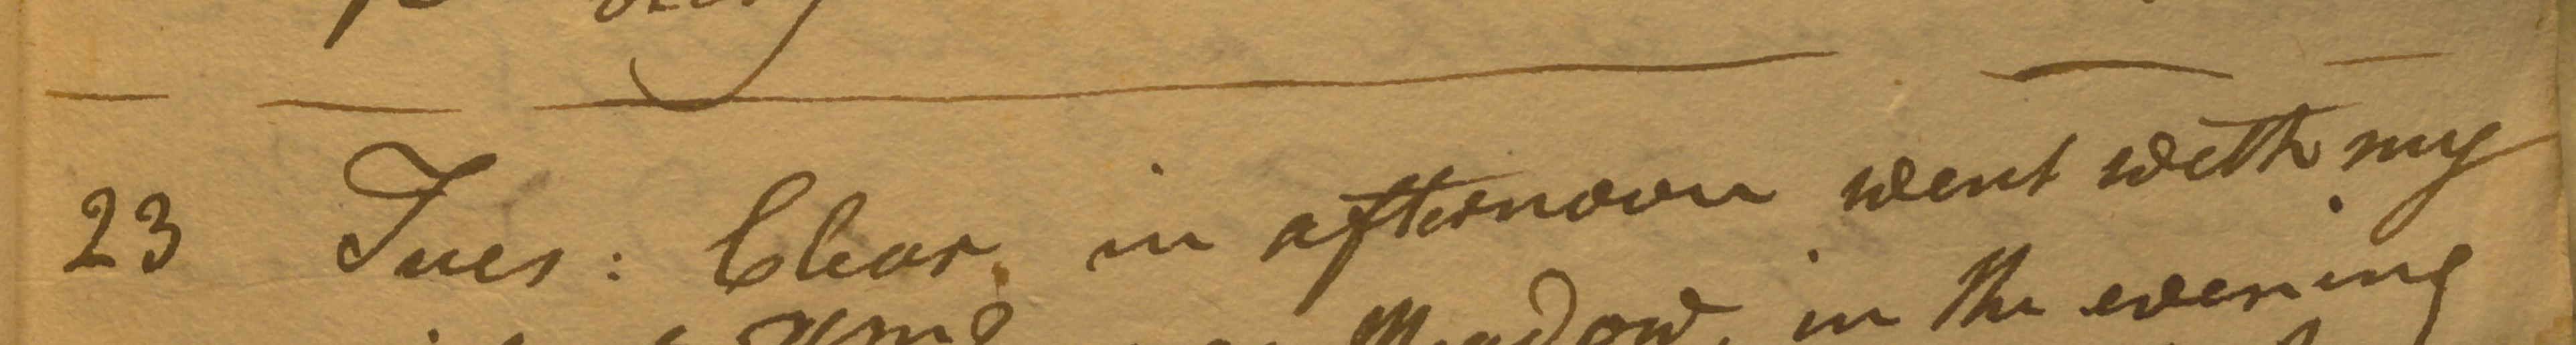23 Tues. Clear, in afternoon went with my
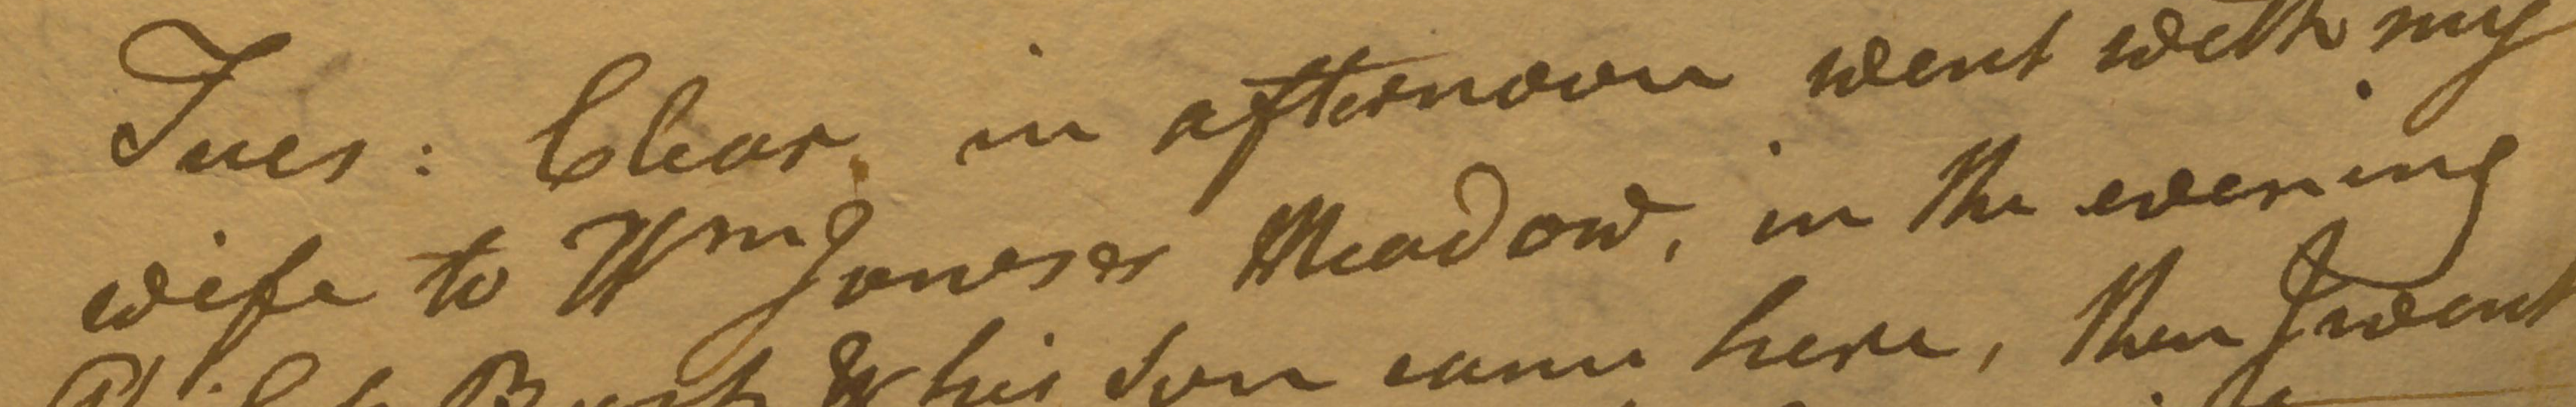wife to W^m Joneses Meadow, in the evening
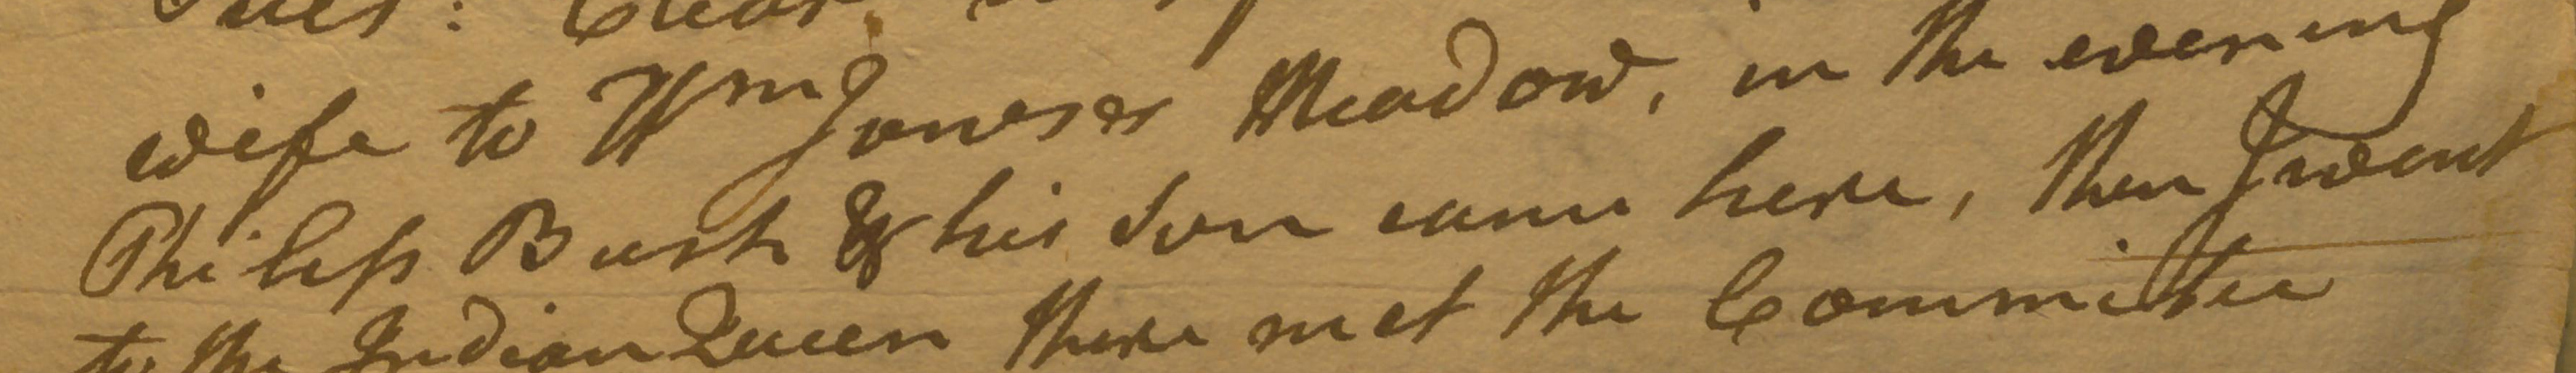Philip Bush & his son came here, then I went
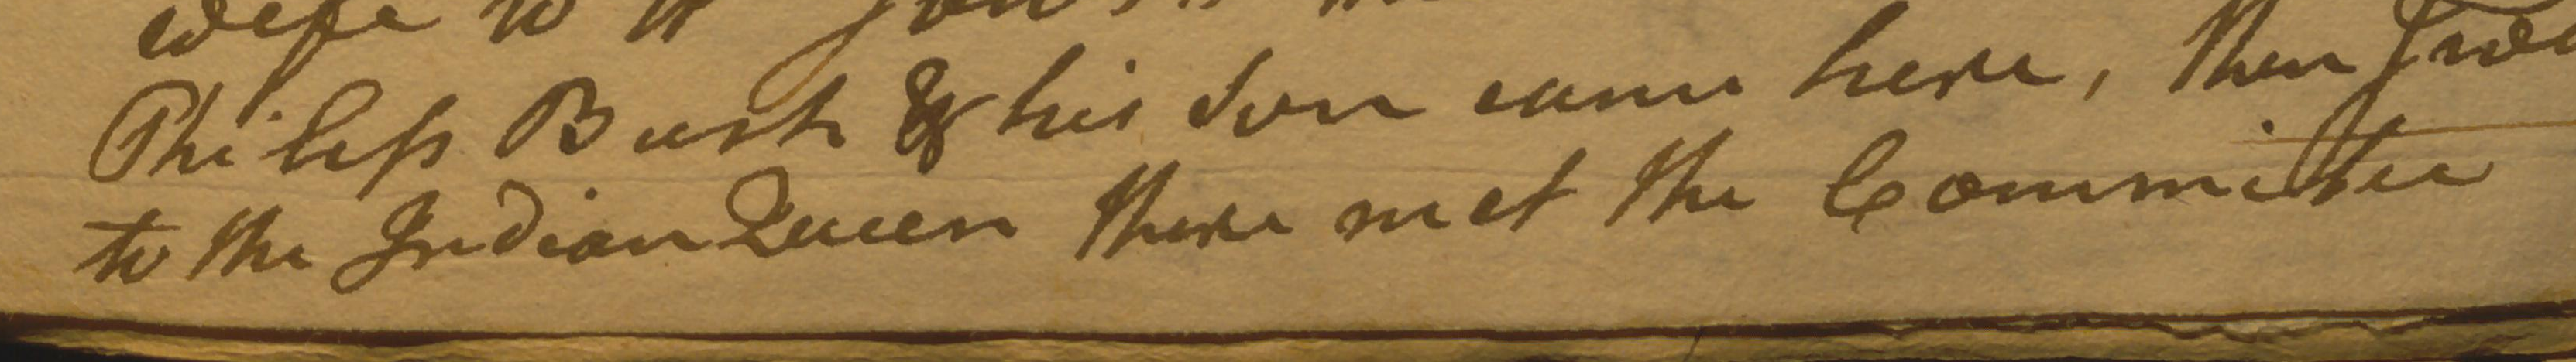to the Indian Queen there met the Committee
